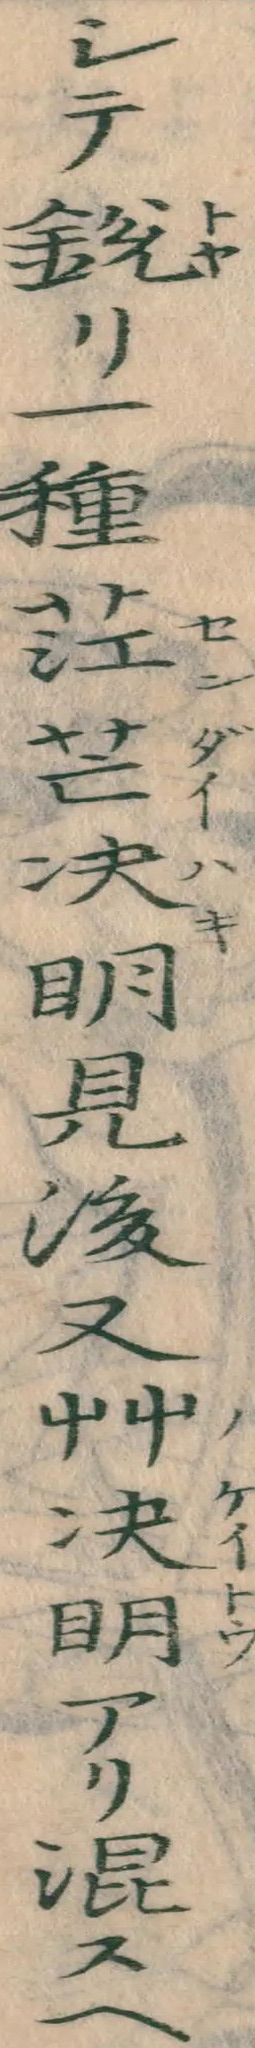シテ鋭リ一種茳芒決明見後又艸決明アリ混スヘ
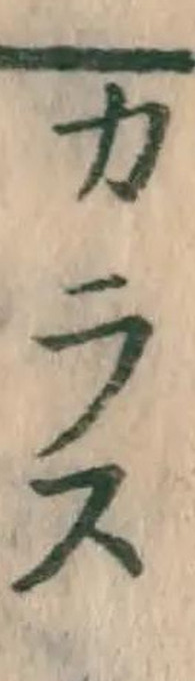カラス
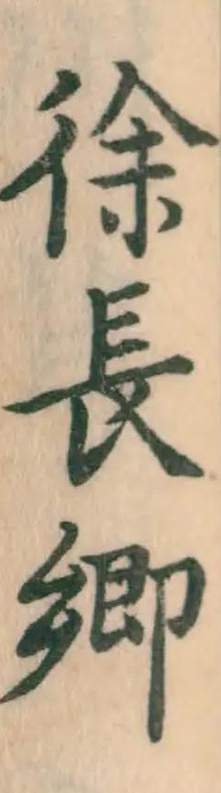徐長郷

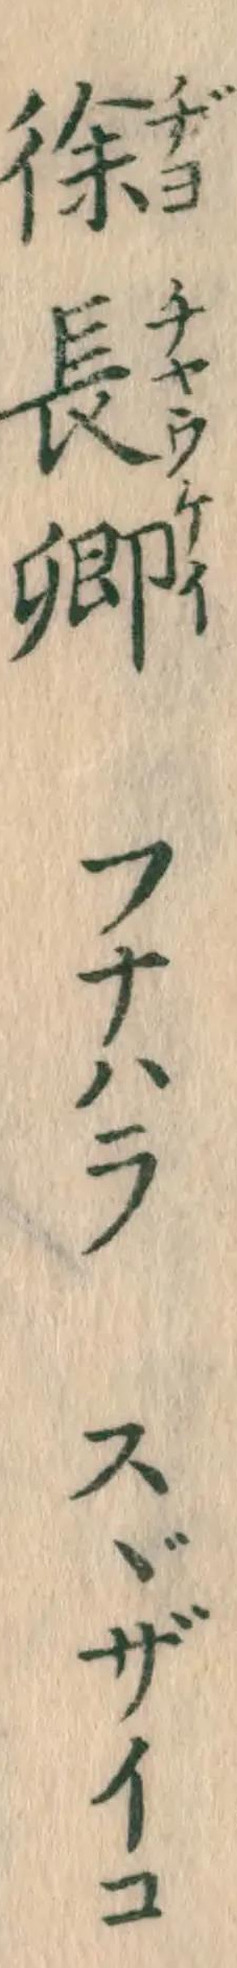徐長卿フナハラスヾザイコ
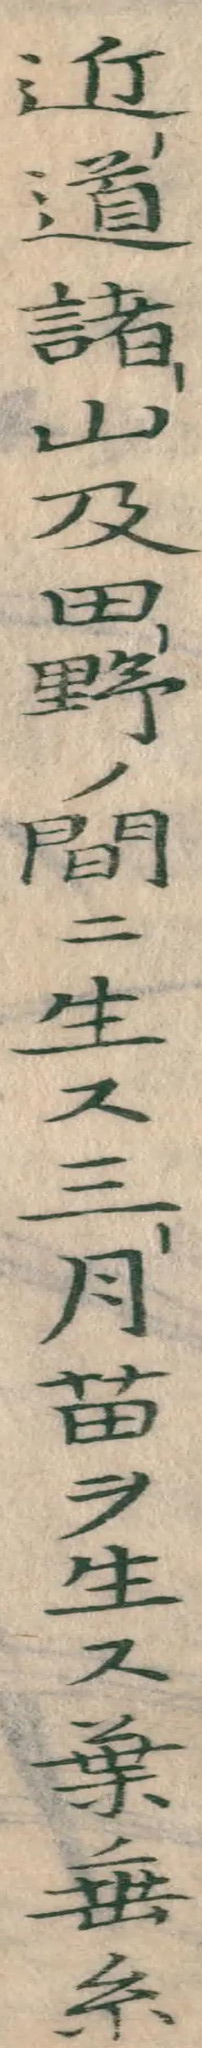近-道諸-山及田-野ノ間ニ生ス三-月苗ヲ生ス葉垂糸
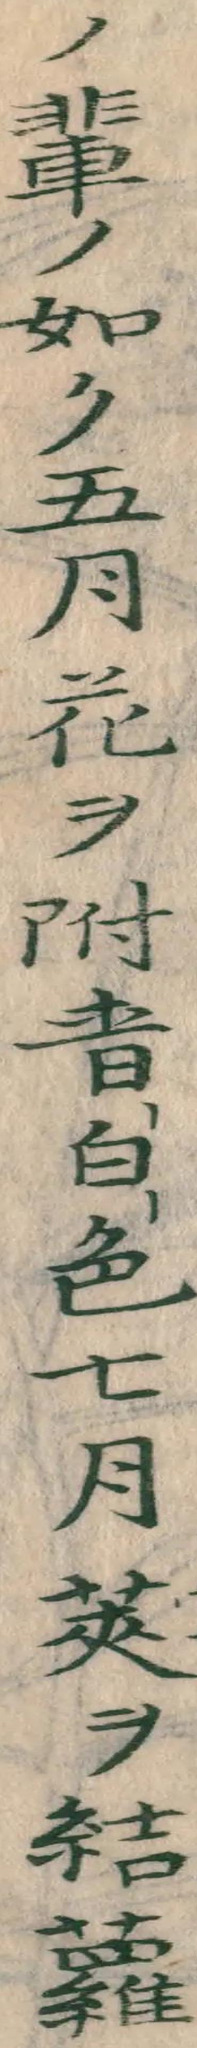ノ輩ノ如ク五月花ヲ附青-白-色七月莢ヲ結蘿
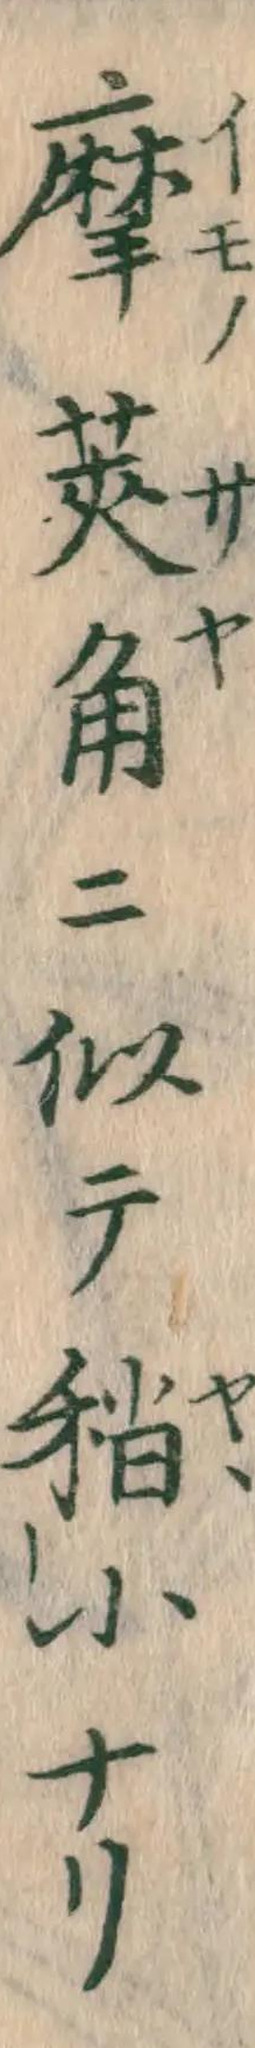摩莢角ニ似テ稍-小ナリ

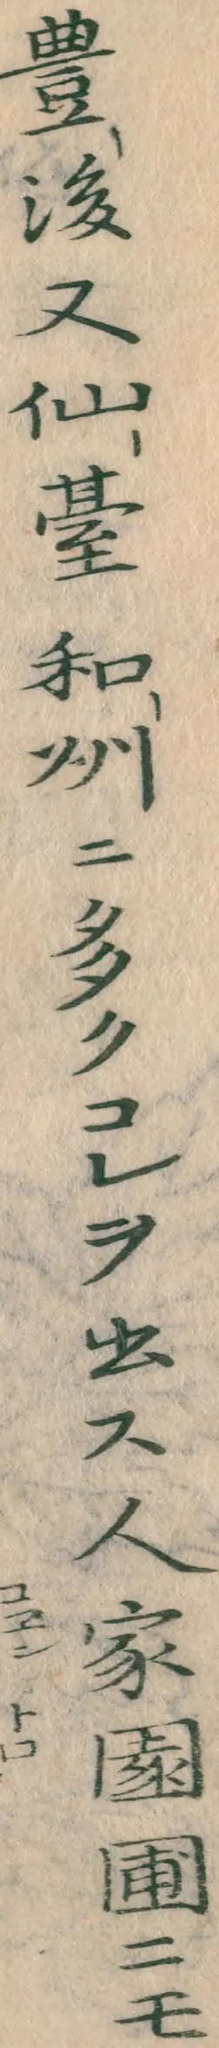豊-後又仙-台和-州ニ多クコレヲ出ス人家園圃ニモ
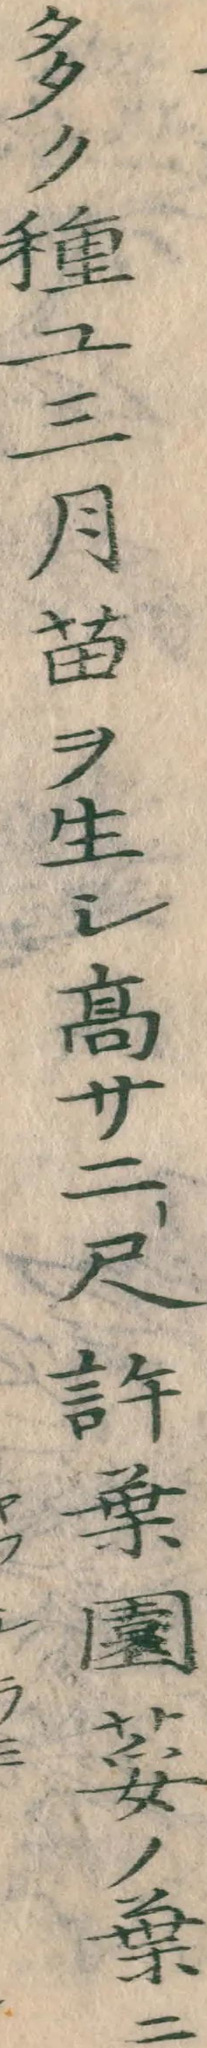多ク種ユ三月苗ヲ生シ高サ二-尺許葉園荽ノ葉ニ
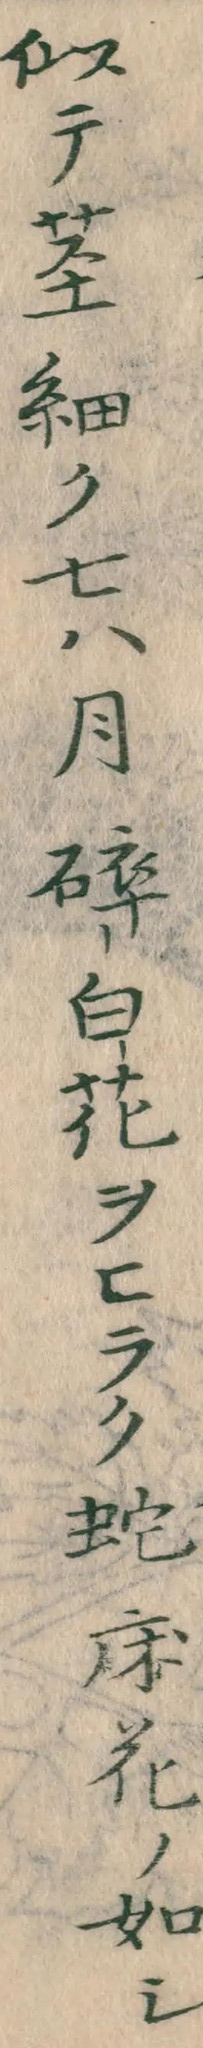似テ茎細ク七八月砕-白-花ヲヒラク蛇床花ノ如シ

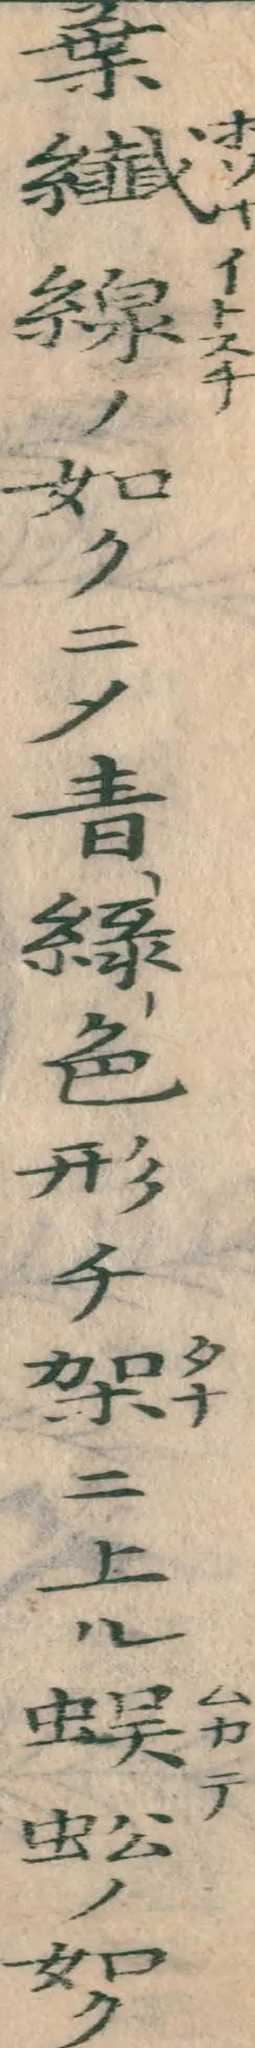葉繊線ノ如クニシテ青-緑-色形チ架ニ上ル蜈蚣ノ如ク
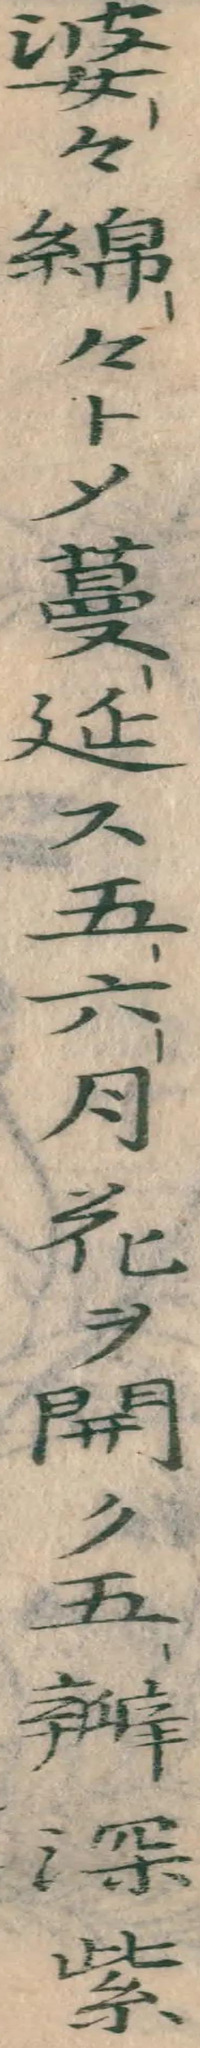婆-々綿-々トシテ蔓-延ス五-六-月花ヲ開ク五-弁深紫
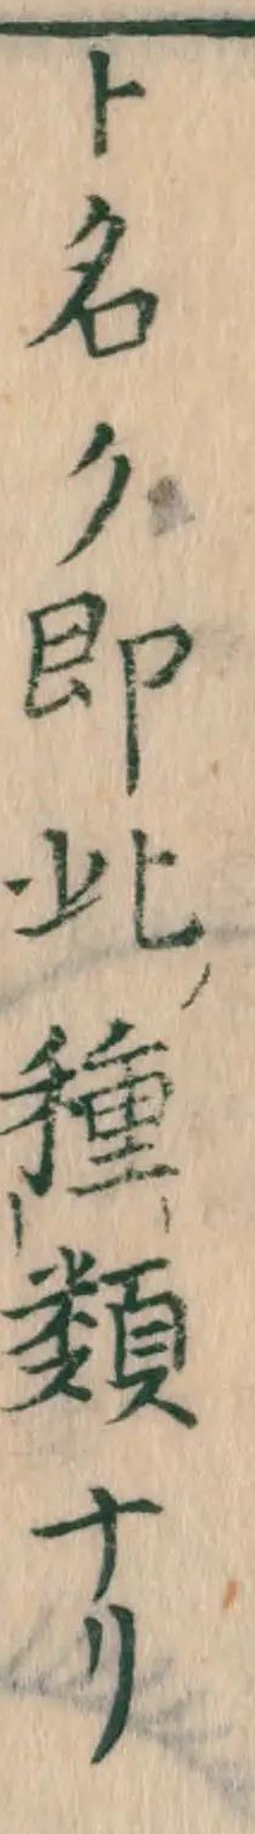ト名ク即此種-類ナリ
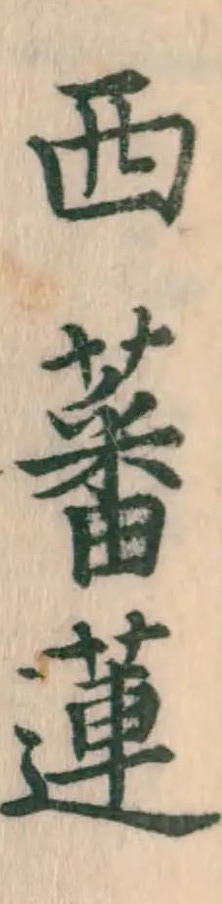西蕃蓮

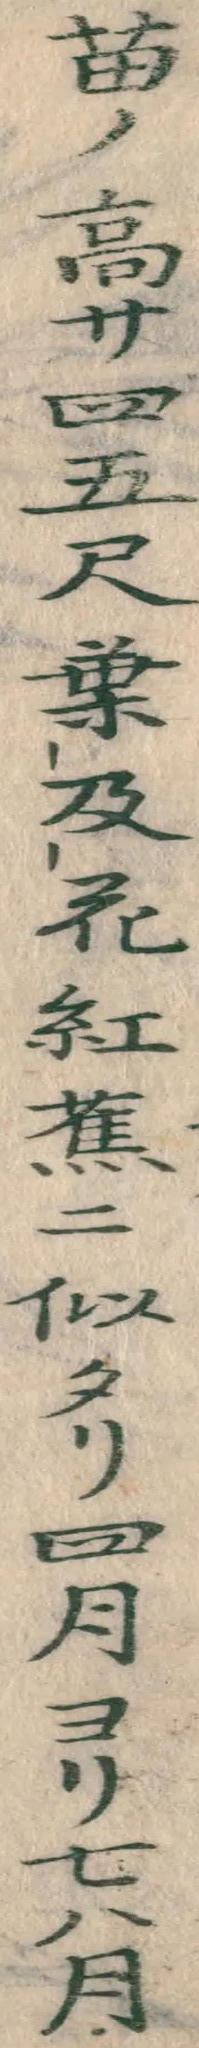苗ノ高サ四五尺葉-及-花紅蕉ニ似タリ四月ヨリ七八月
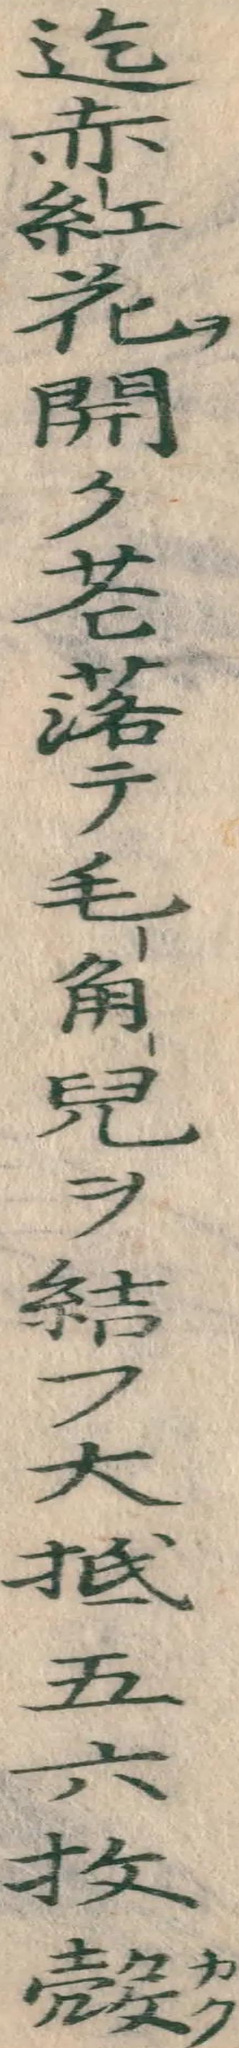迄赤-紅花開ク花落テ毛-角-児ヲ結フ大抵五六枚殻
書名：花彙 草部4巻木部4巻. [1]
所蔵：国立国会図書館 National Diet Library, JAPAN
